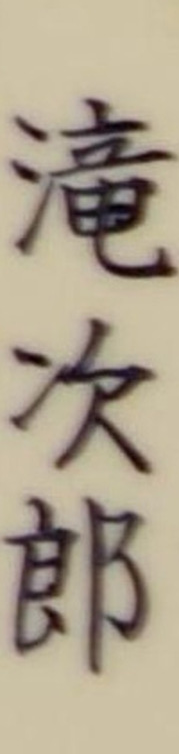滝次郎
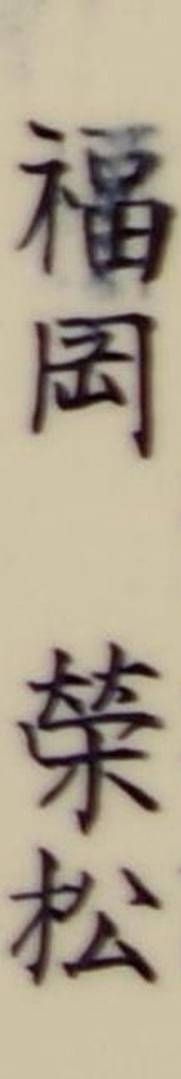福岡榮松
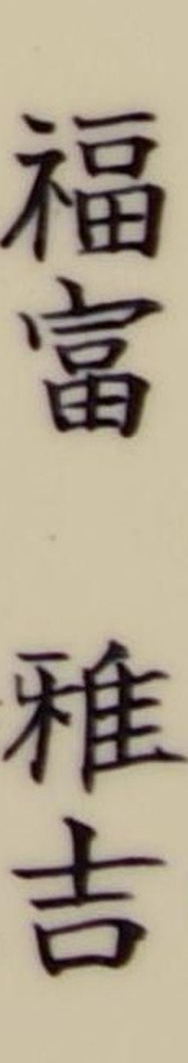福富雅吉
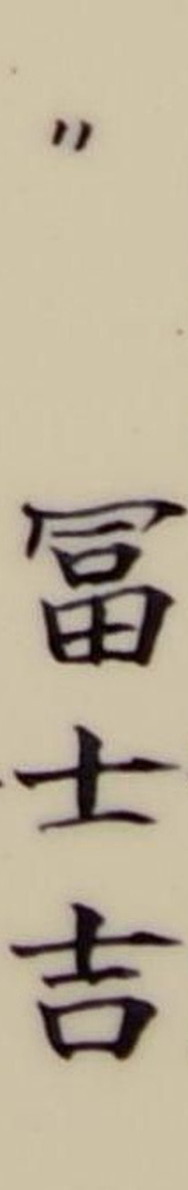冨士吉
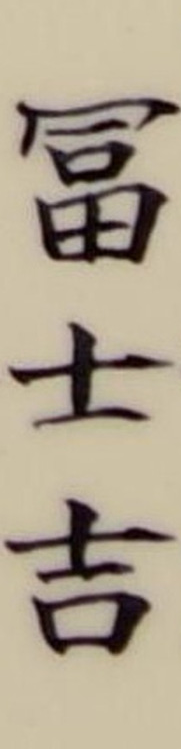冨士吉
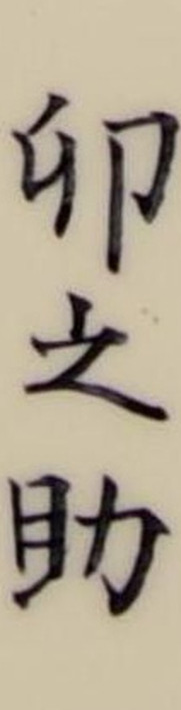卯之助
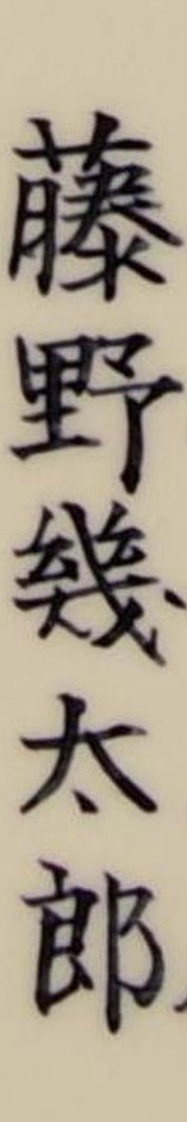藤野幾太郎
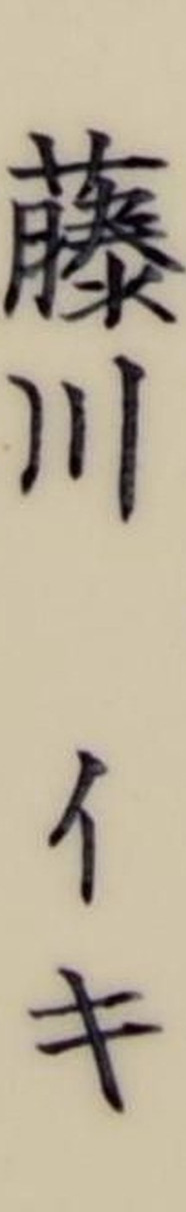藤川イキ
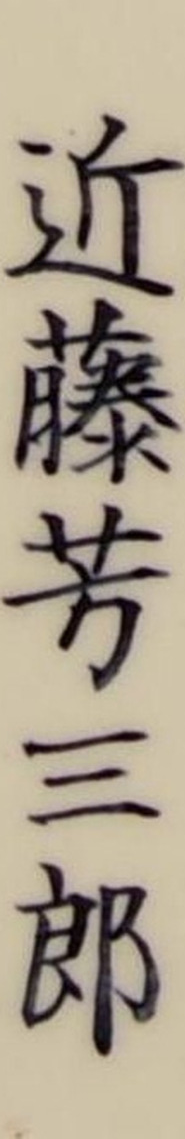近藤芳三郎
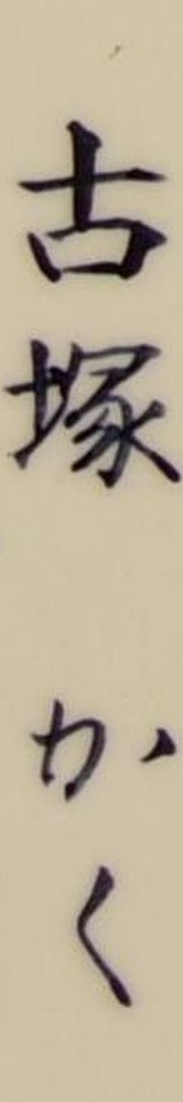古塚かく
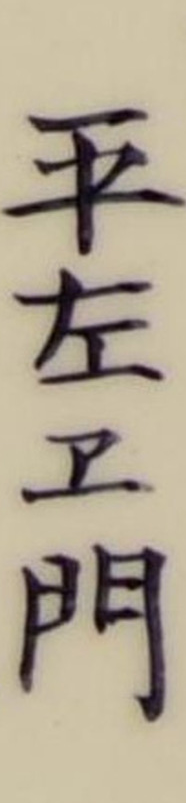平左ヱ門
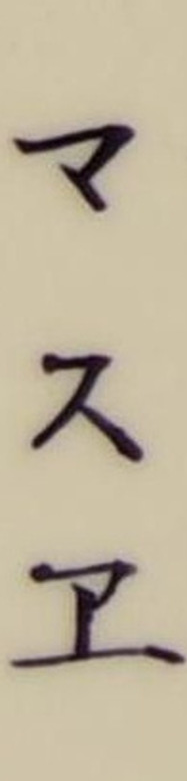マスエ
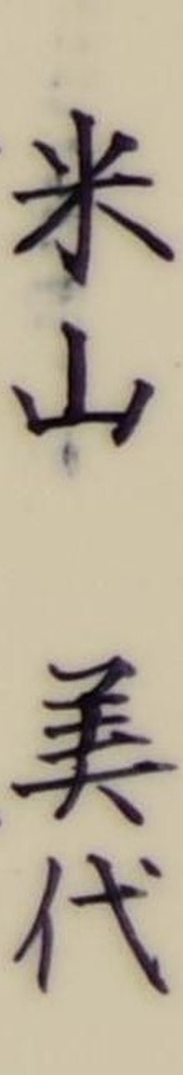米山美代

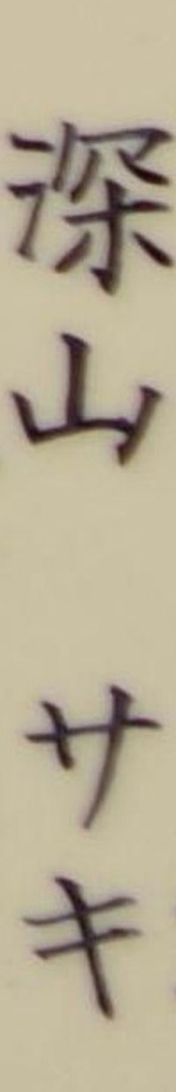深山サキ
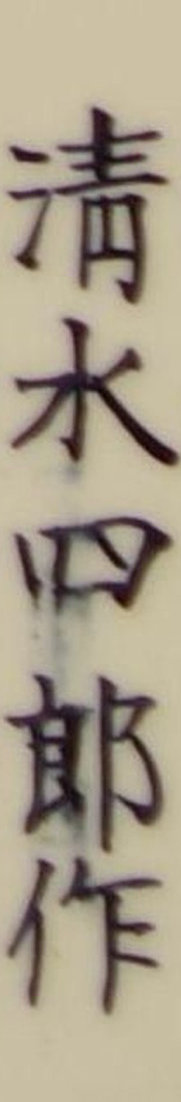清水四郎作
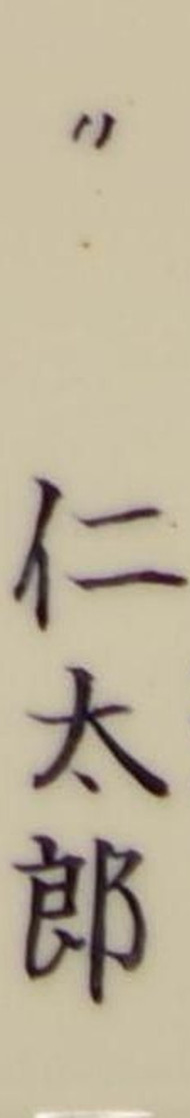仁太郎
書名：E~L
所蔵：高野山金剛峯寺
